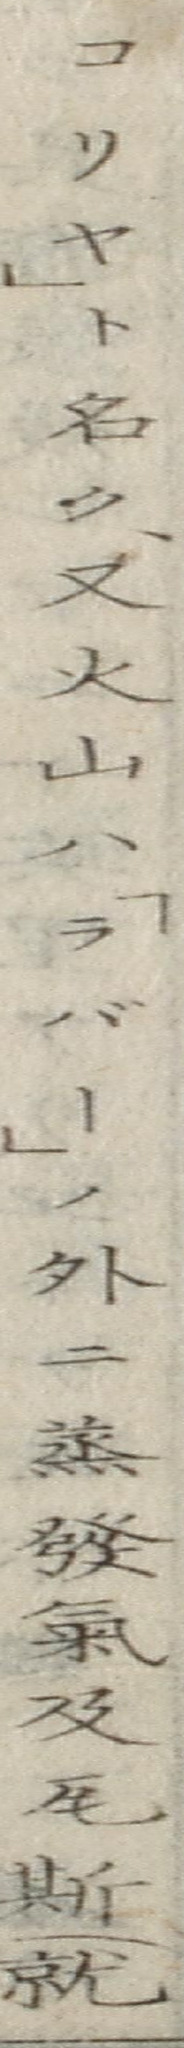コリヤ」ト名ク、又火山ハ「ラバー」ノ外ニ蒸発気及瓦斯（就
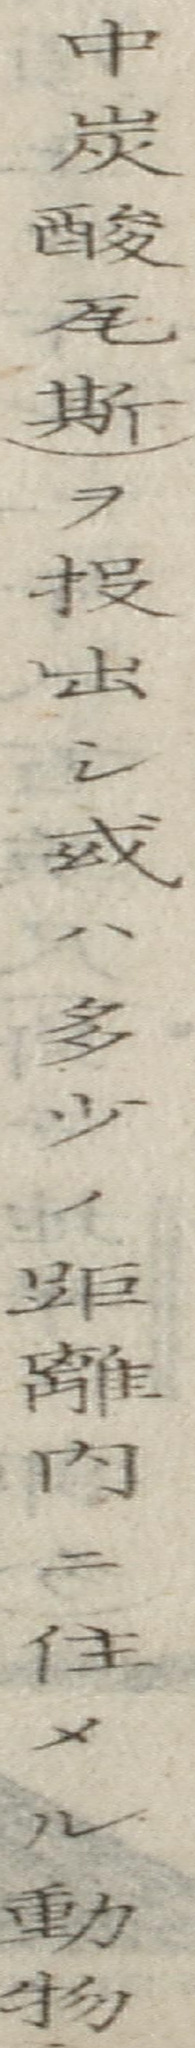中炭酸瓦斯）ヲ投出シ或ハ多少ノ距離内ニ住メル動物
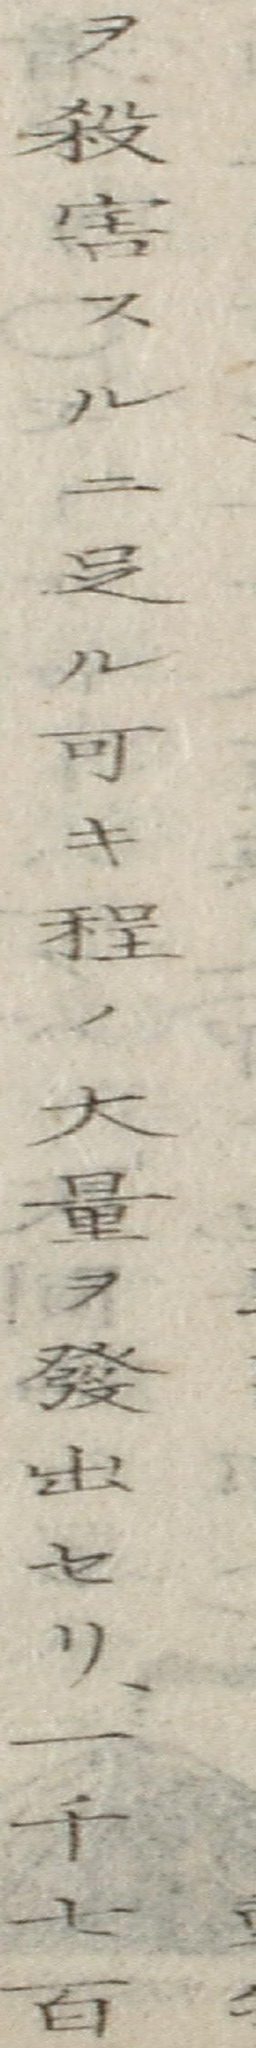ヲ殺害スルニ足ル可キ程ノ大量ヲ発出セリ、一千七百
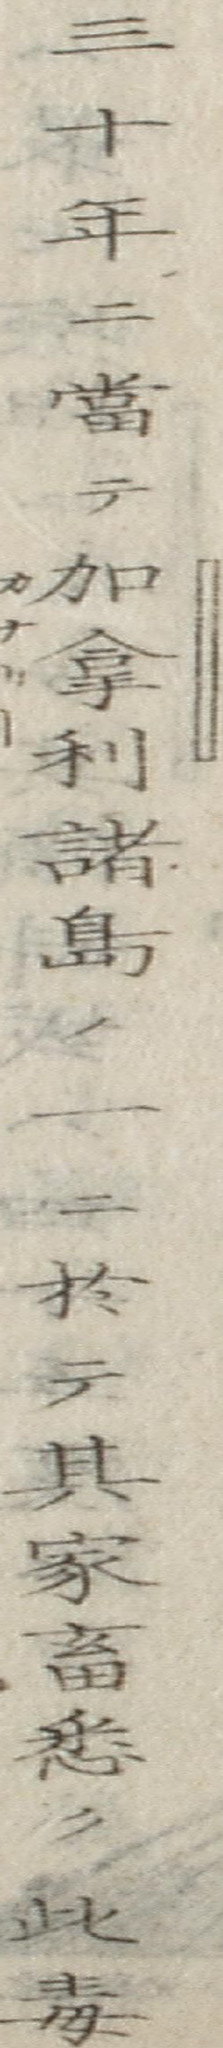三十年ニ当テ加拿利諸島ノ一ニ於テ其家禽悉々此
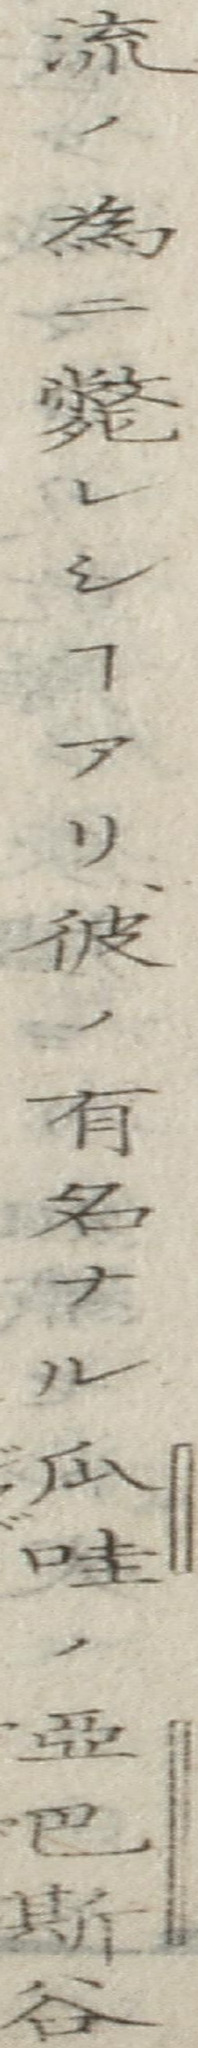流ノ為ニ斃レシヿアリ、彼ノ有名ナル瓜哇ノ亜巴斯谷
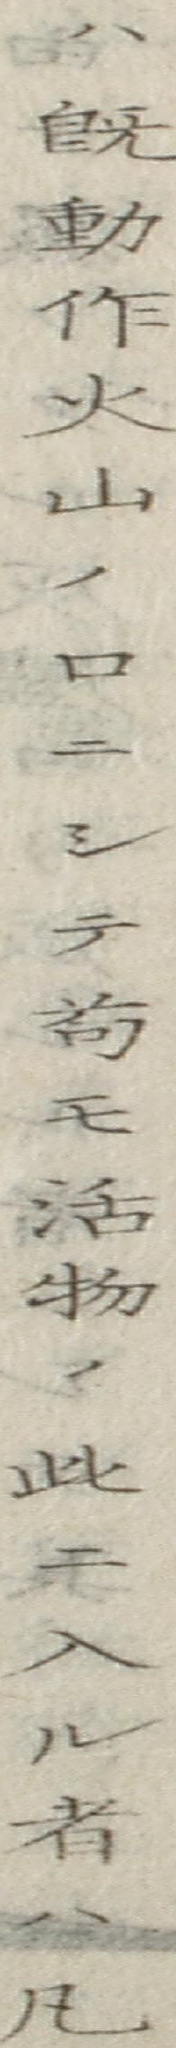ハ既動作火山ノ口ニシテ苟モ活物ノ此ニ入ル者ハ凡
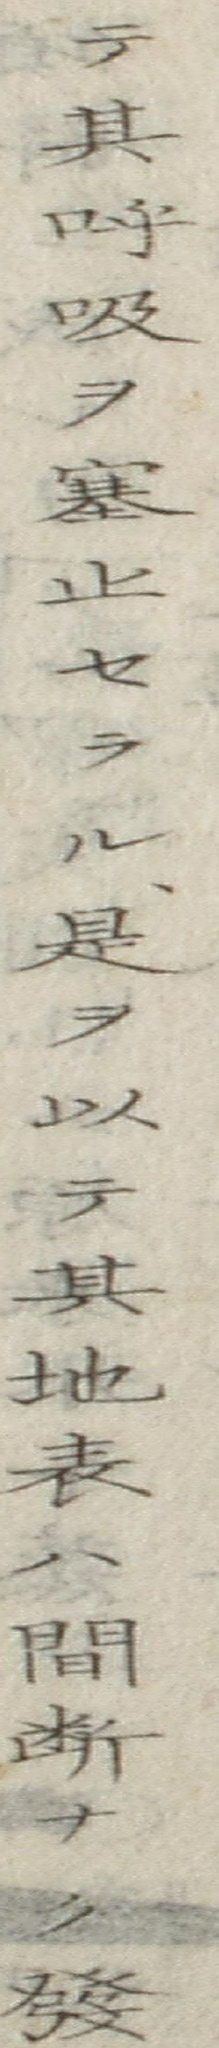テ其呼吸ヲ塞止セラル、是ヲ以テ其地表ハ間断ナク発
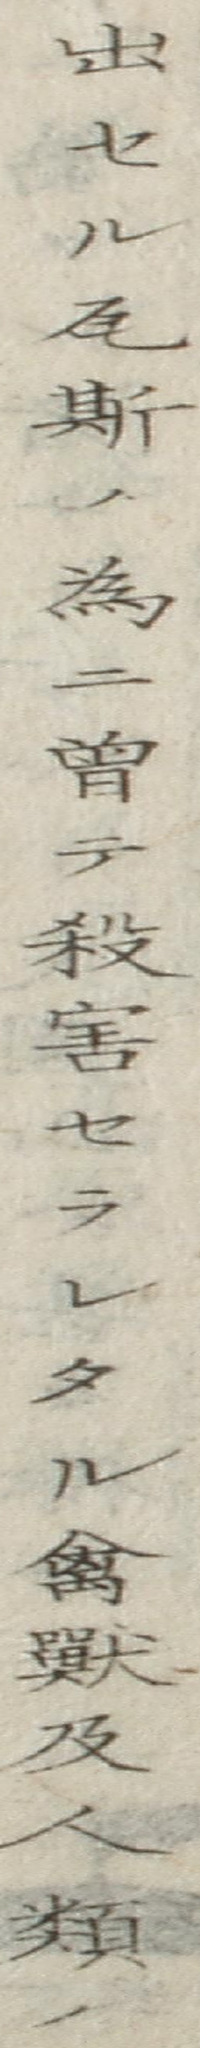出セル瓦斯ノ為ニ曾テ殺害セラレタル禽獣及人類ノ
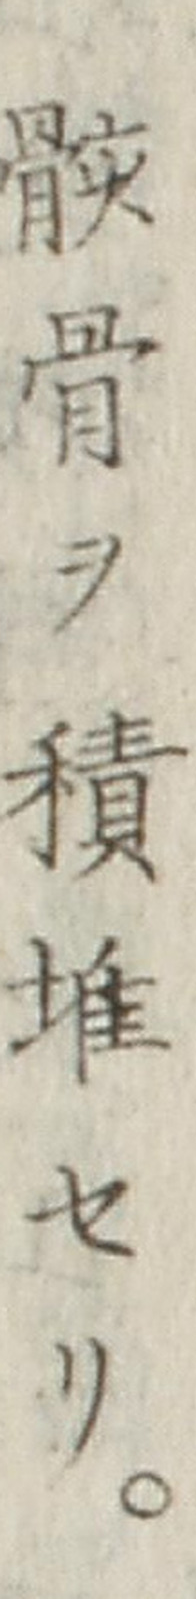骸骨ヲ積堆セリ。
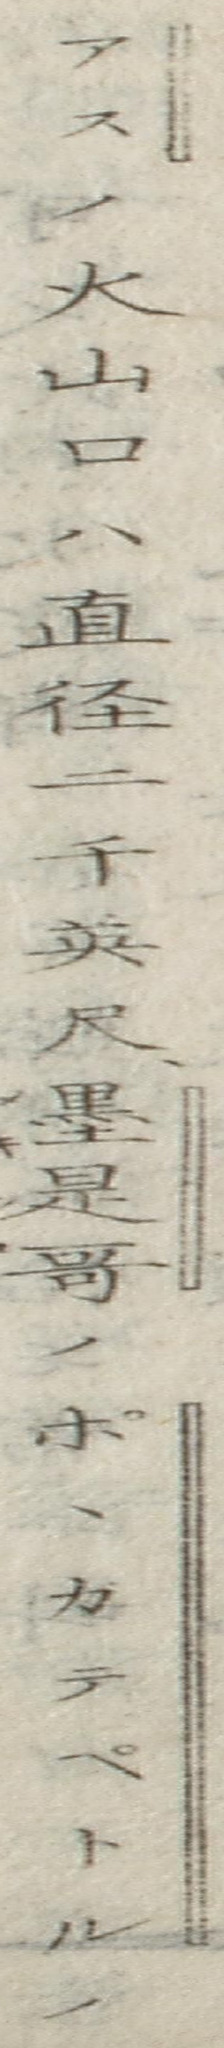アスノ火山口ハ直径二千英尺、墨是哥ノポヽカテペトルノ
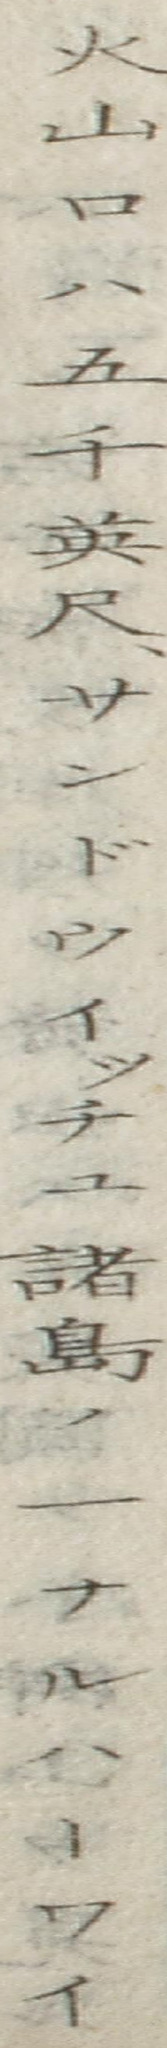火山口ハ五千英尺、サンドウイッチュ諸島ノ一ナルハーワイ
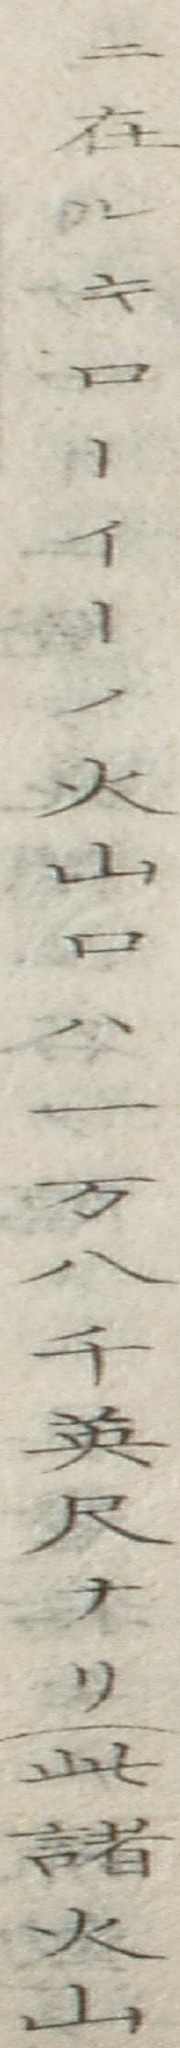ニ在ルキローイーノ火山口ハ一万八千英尺ナリ（此諸火山
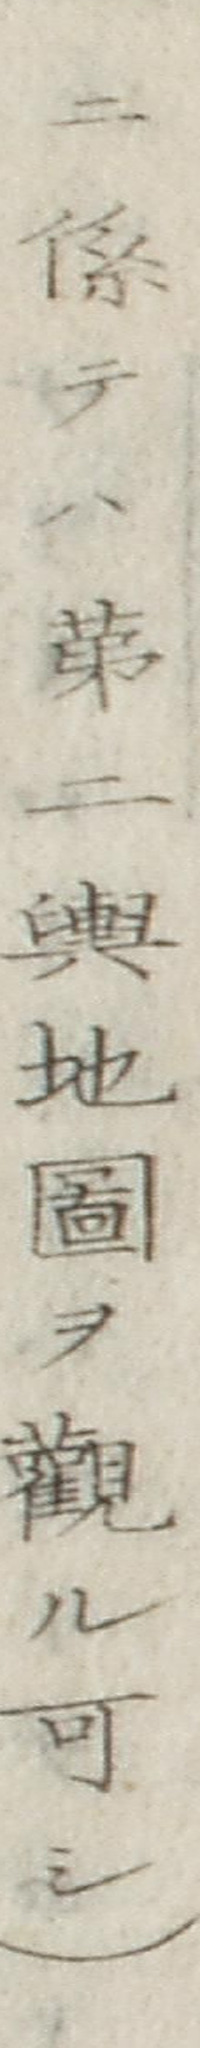ニ係テハ第二輿地図ヲ観ル可シ）
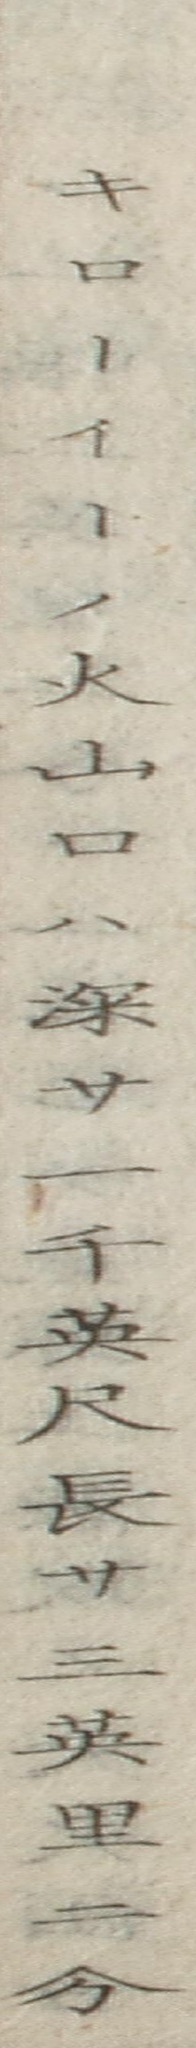キローイーノ火山口ハ深サ一千英尺長サ三英里二分

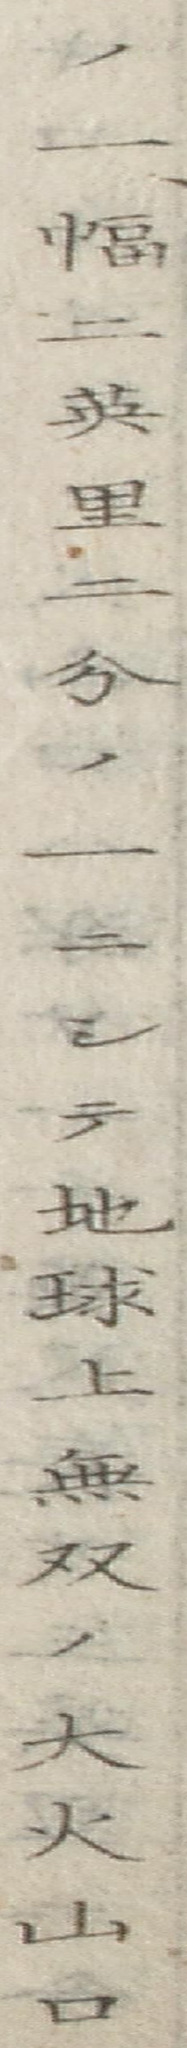ノ一、幅二英里二分ノ一ニシテ地球上無双ノ大火山口
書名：地形論　巻二
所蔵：東京大学地震研究所図書室 Earthquake Research Institute Library, The University of Tokyo, JAPAN
